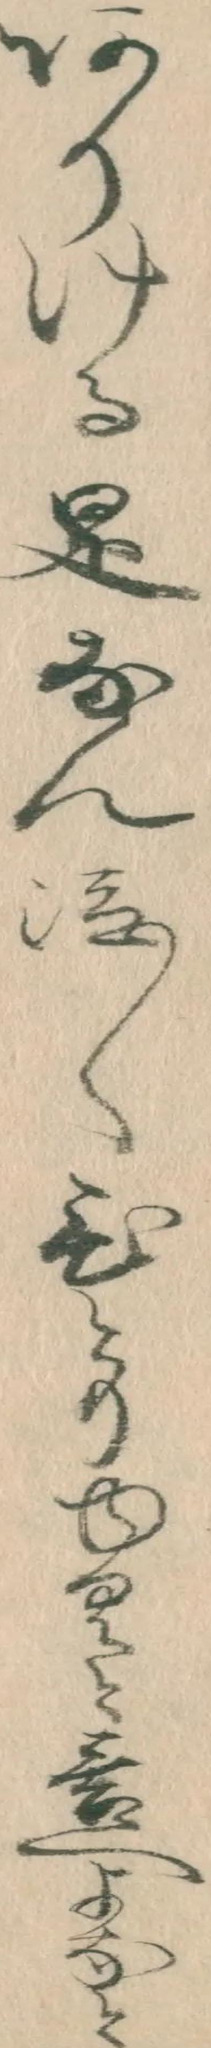ありける是なん泣〳〵ひとりゆくと答へよなと
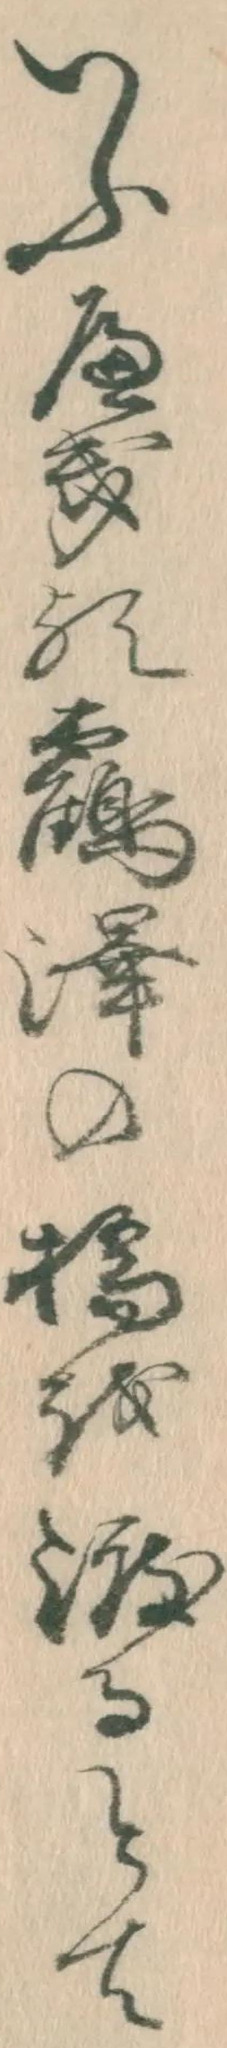いふへき歟鶴沢の橋を渡るとて
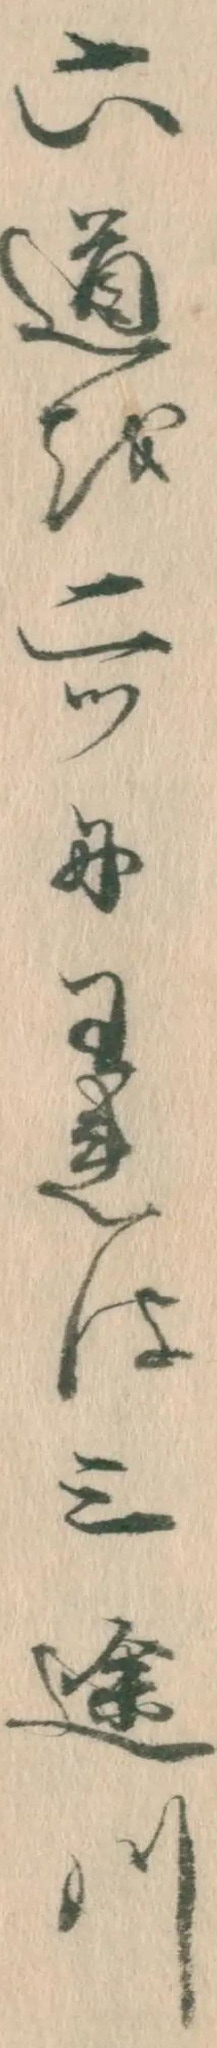六道を二ツにわれは三途川
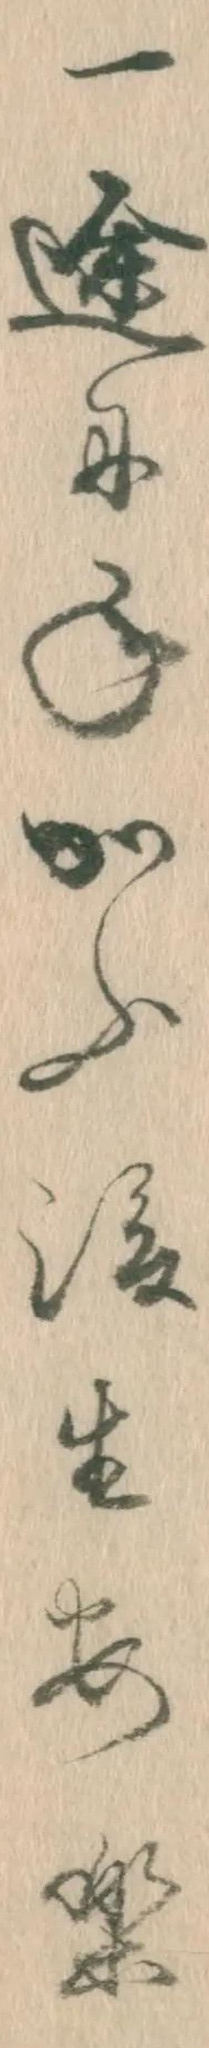一途にねがふ後生安楽
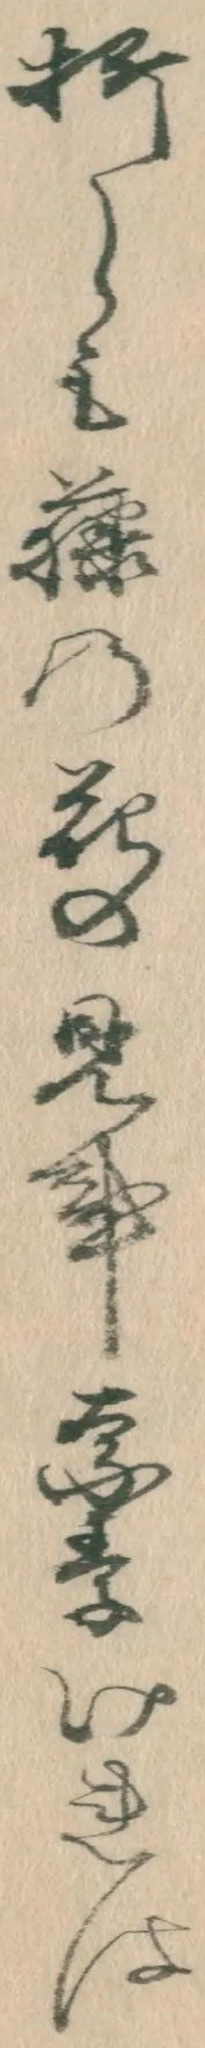折しも藤の花の見事なりけれは
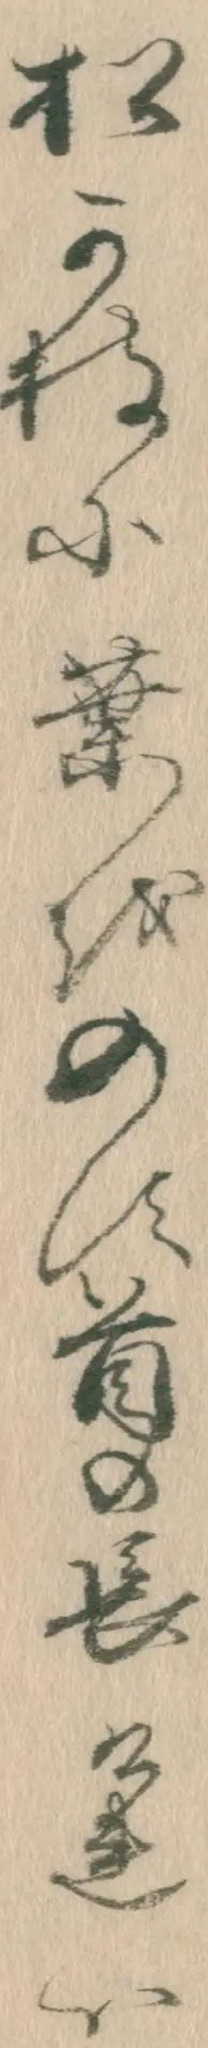松か枝に葉をのす首の長けれは
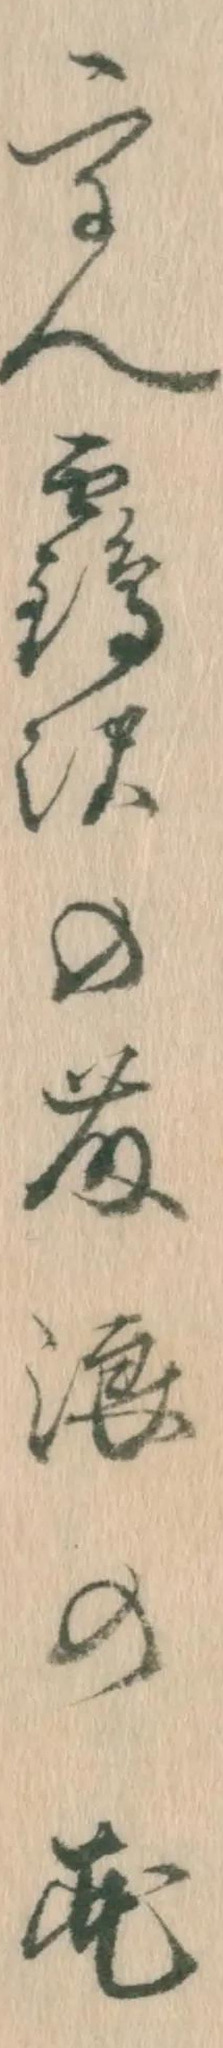うへ鶴沢の藤浪の花
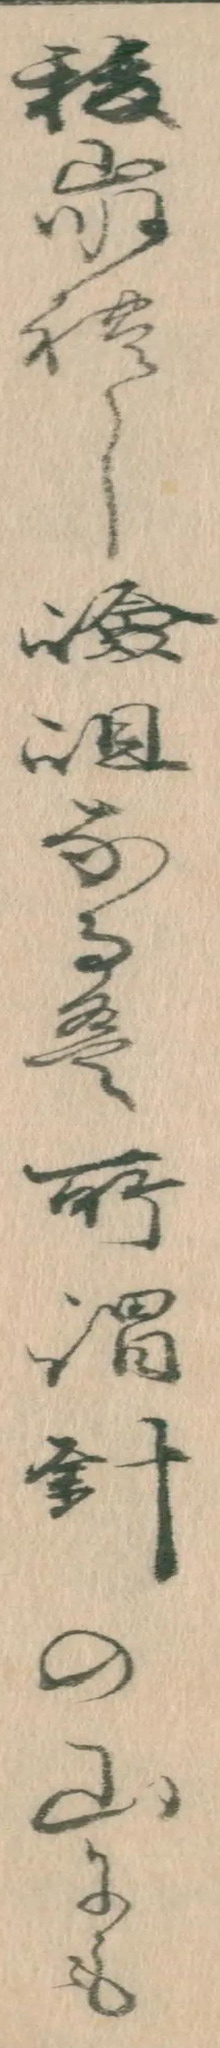抜崩れし嶮岨なるは所謂針の山にも
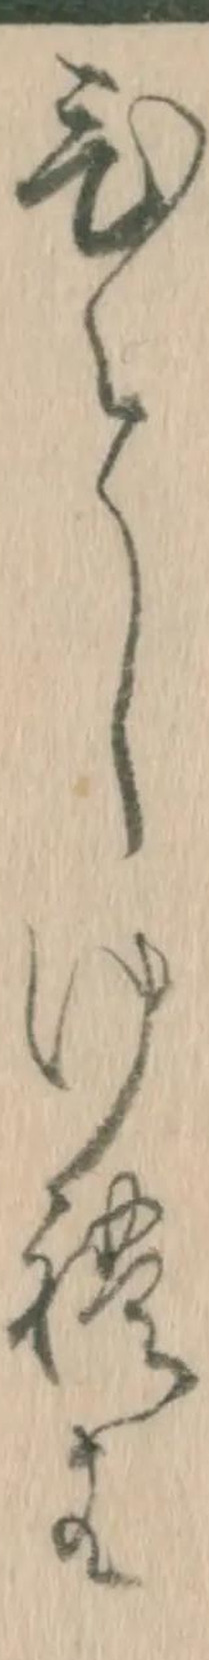ひとしければ
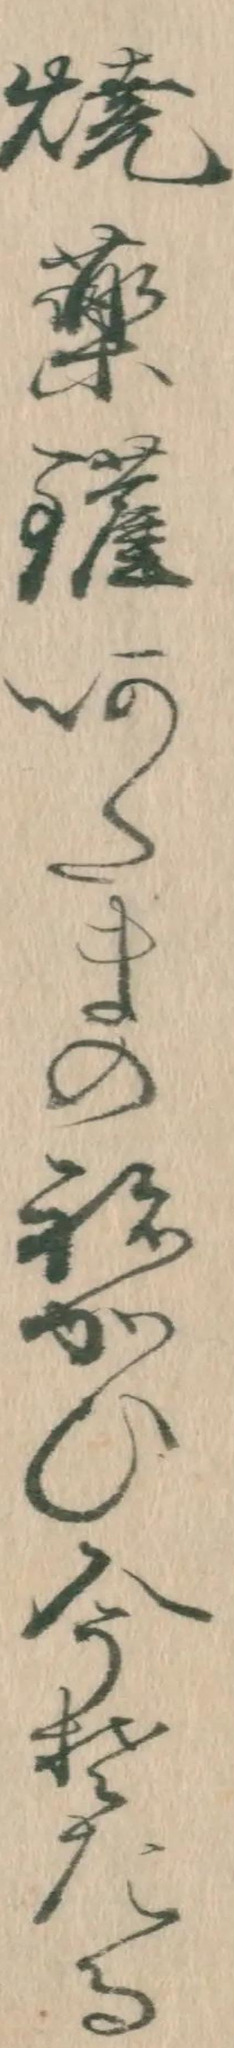焼薬鑵あたまのねがひ今そたる
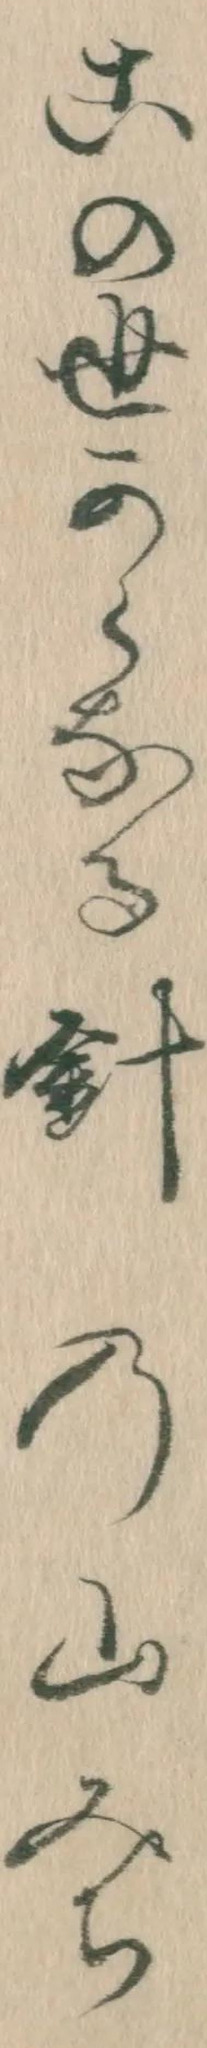この世からなる針の山みち
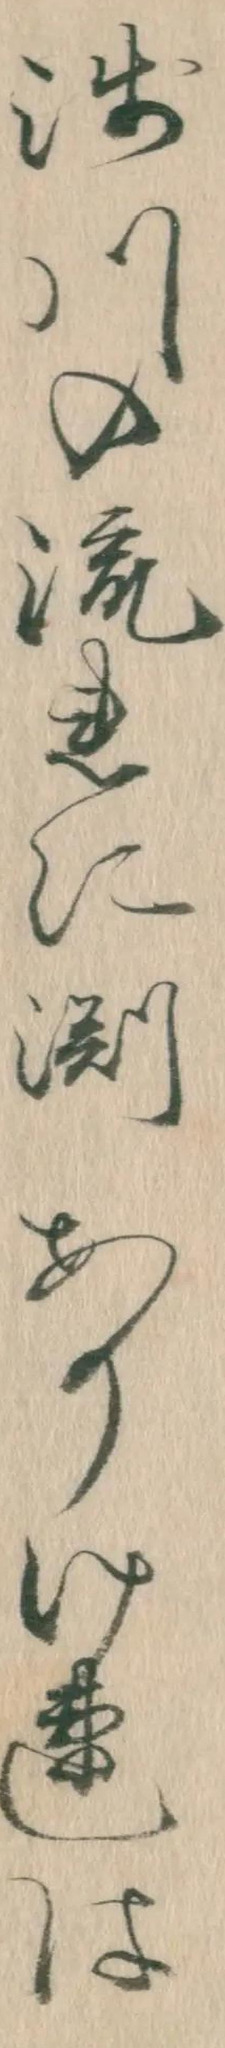浅川の流れに渕ありけれは
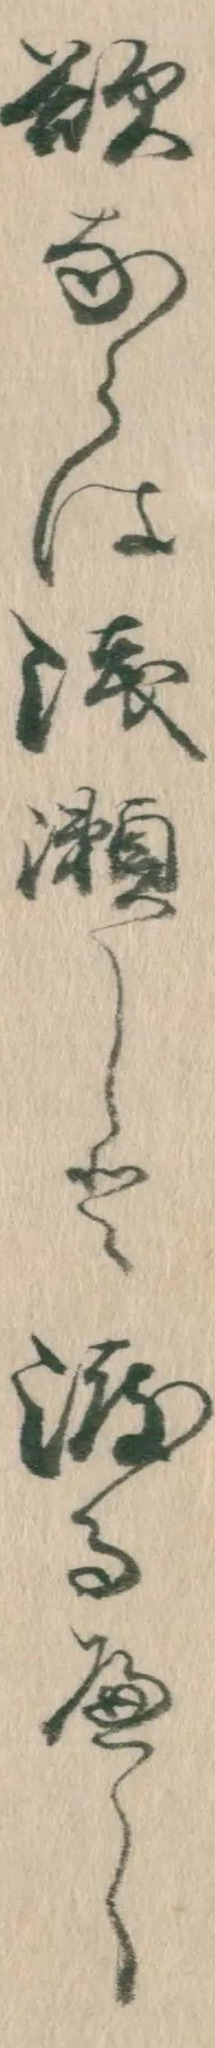欲ならは浅瀬〳〵と渡るへし
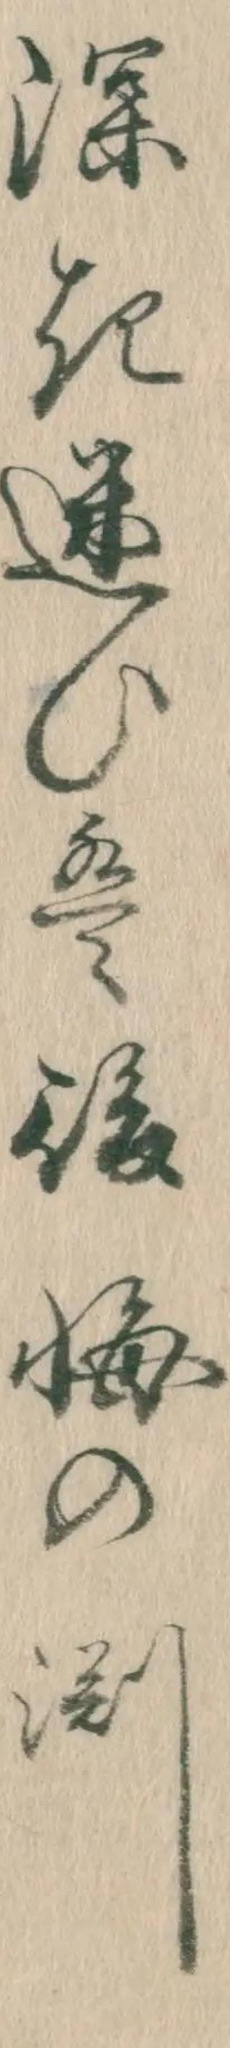深き迷ひは後悔の渕
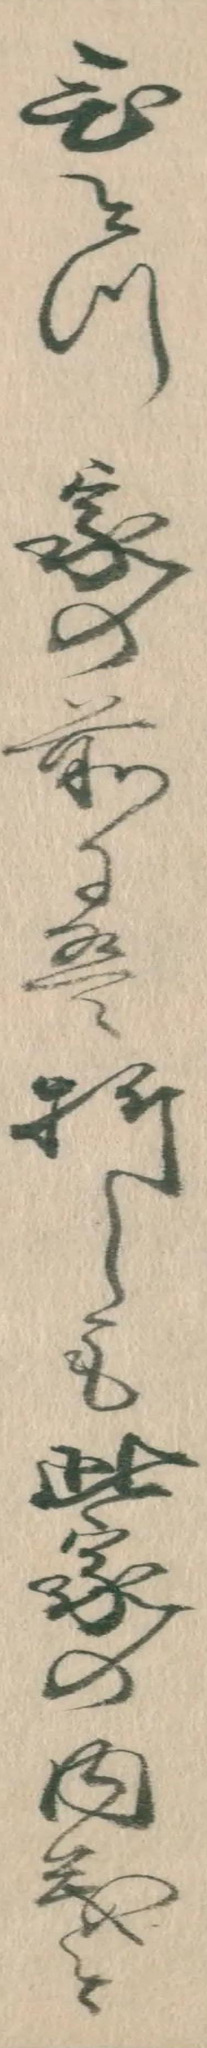ひとつ家の前には折しも此家の内義と
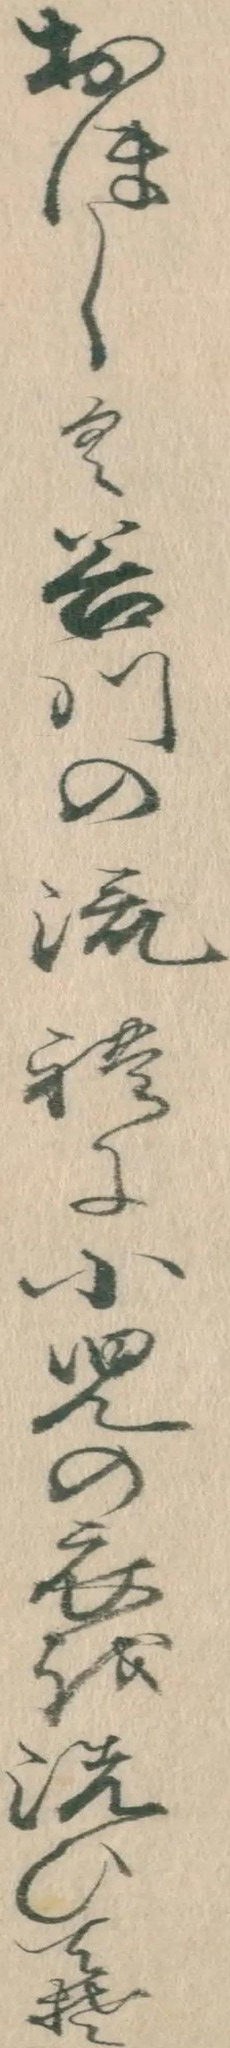おほしく谷川の流れに小児の衣を洗ひてそ
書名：俗語之種. [6]
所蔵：国立国会図書館 National Diet Library, JAPAN
